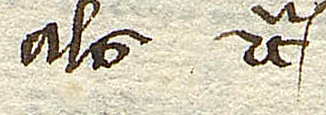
als ec*
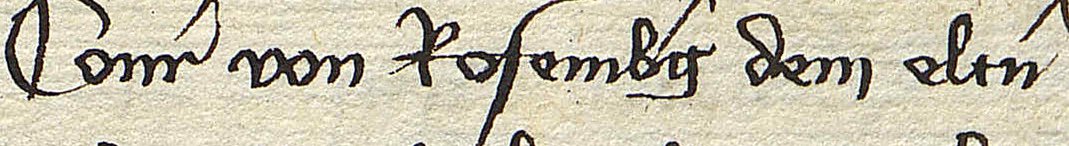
Conr* von Roſemb*g dem elt*n
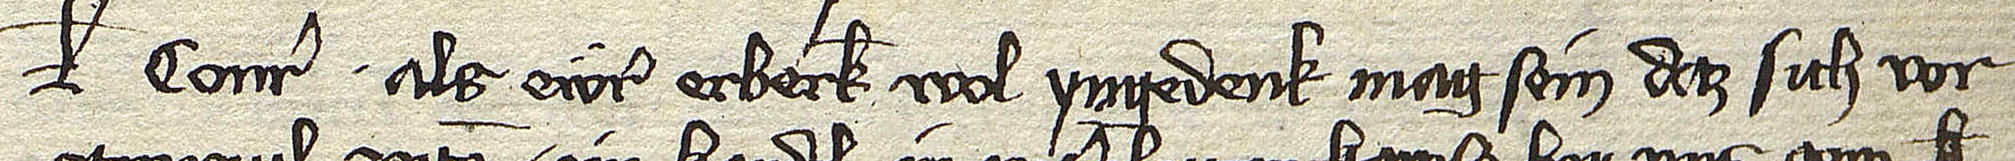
L* Conr* . als ew*r erberk* wol yngedenk mag ſein daʒ ſich vor
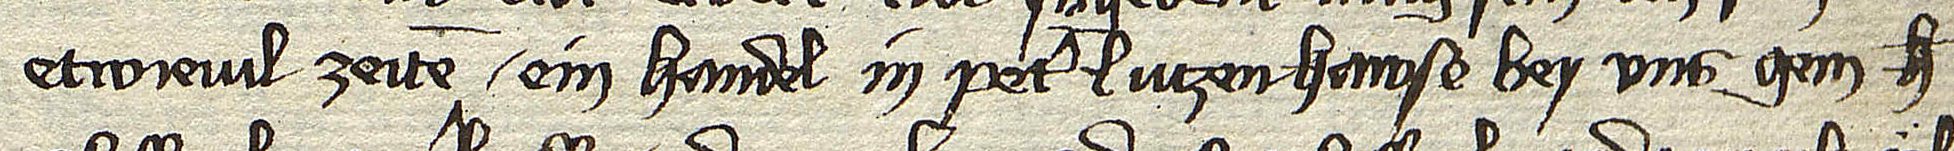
etwieuil ʒeite* / ein handel in pet* lucʒen hawſe bey vns gein h*
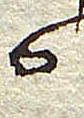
%
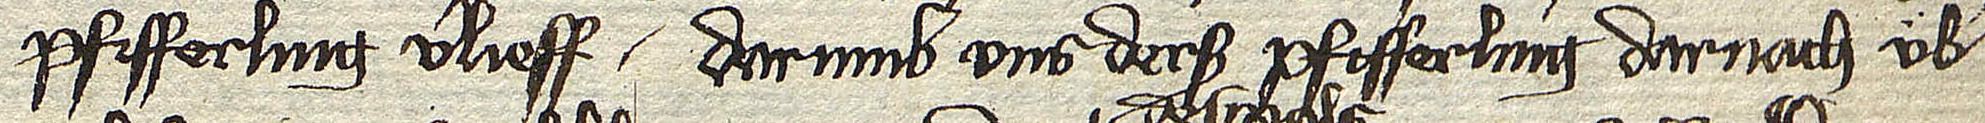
Pfifferling v*lieff / darumb vns derſ* pfifferling darnach v̈b*
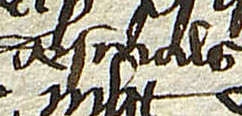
deſmals
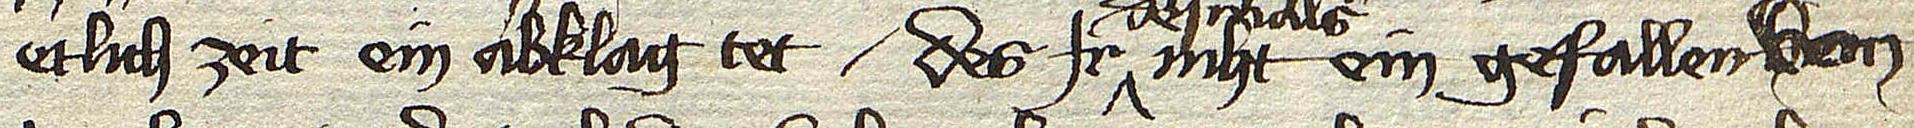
etlich ʒeit ein abklag tet / Des Ir niht ein gefallen Von
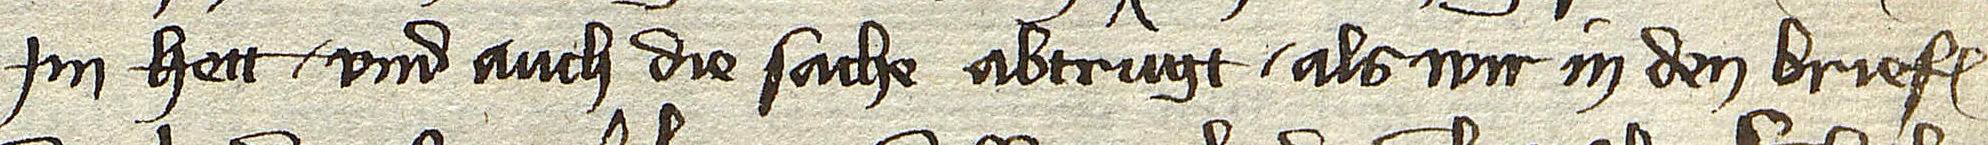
Im hett / vnd auch die ſache abtrugt / als wir in den brief*
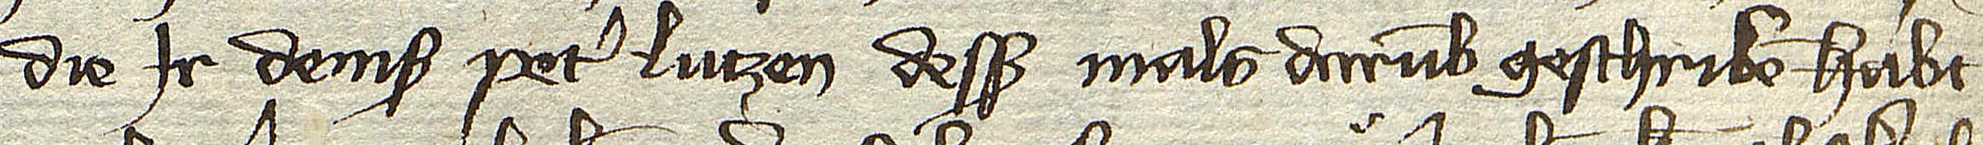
die Ir demſ* pet* Lucʒen deſſ* mals daru*b geſchribe* habt
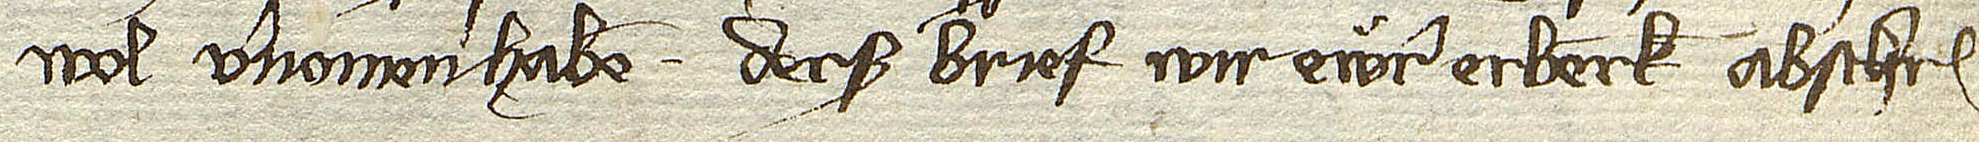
wol v*nomen habe* . derſ* brief wir ew*r erberk* abſchr*
